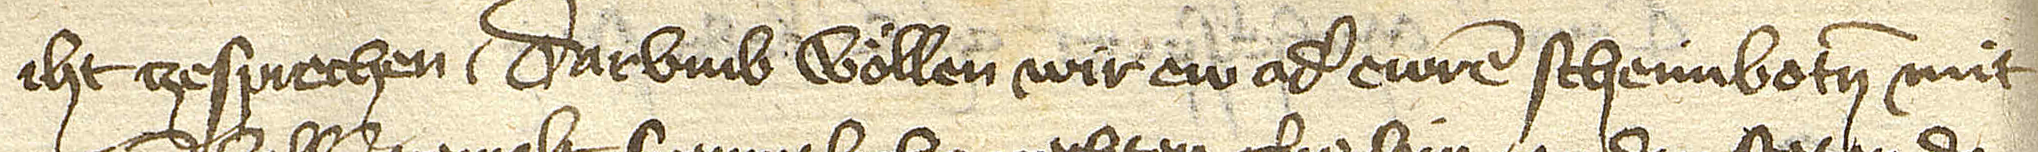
iht cʒeſprechen / Darvmb wöllen wir ew od* ewre* ſcheinbotn* mit
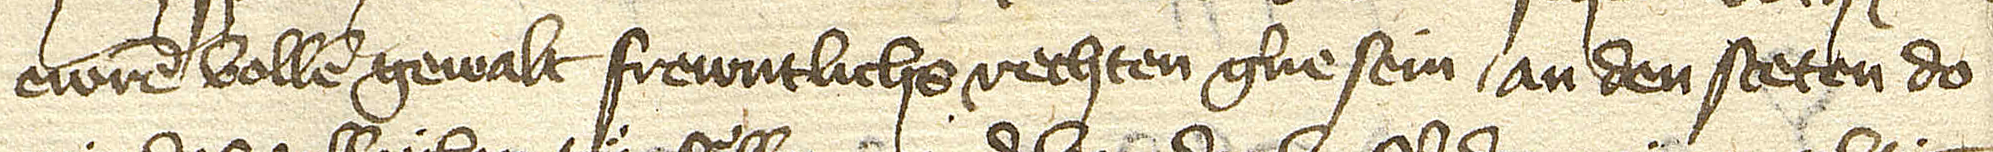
ewre* volle* gewalt frewntlichs rechten g*ne ſein / an den ſteten do
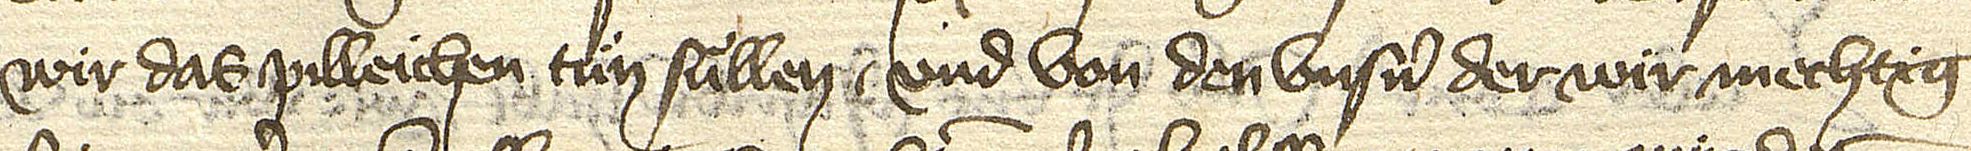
wir das pilleichen tün ſüllen / vnd von den vnſn* der wir mechtig
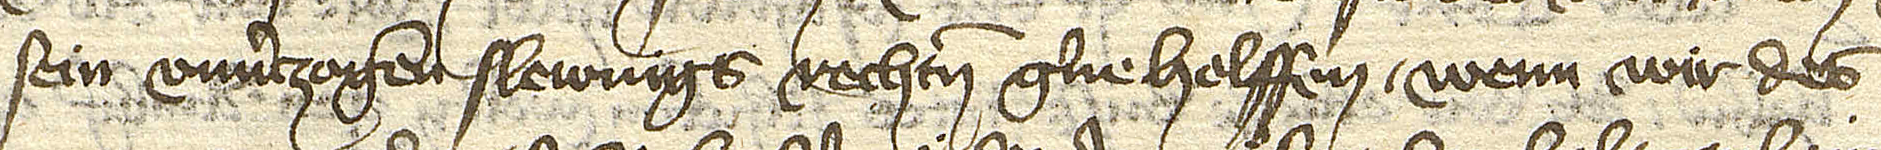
ſein vnu*cʒogen* ſlewnigs rechtn* g*ne helffen / wenn wir des
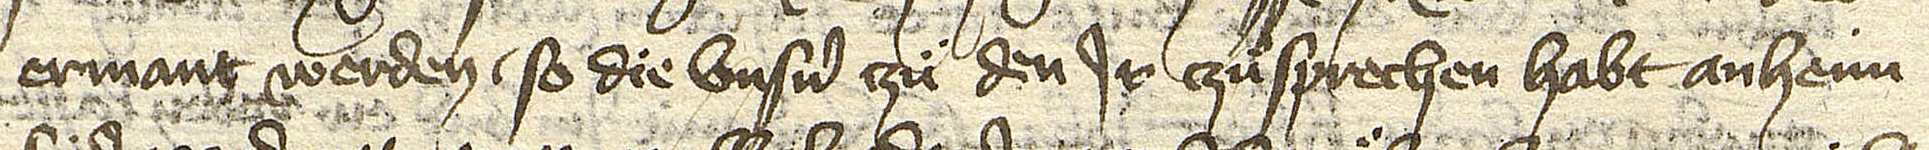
ermant werden / ſo die vnſn* cʒü den Ir cʒü ſprechen habt anheim
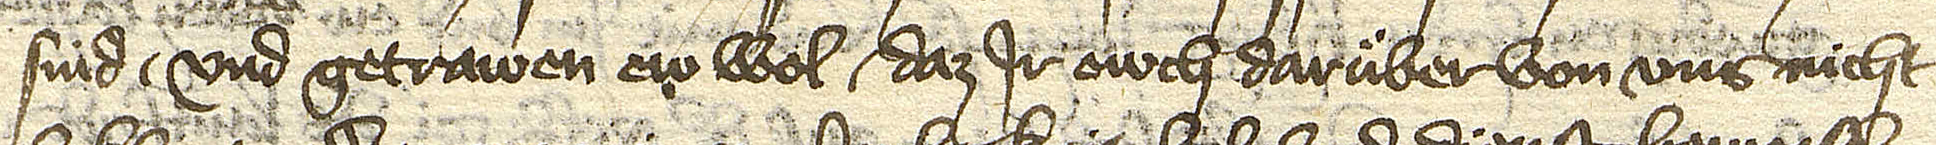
ſind / vnd getrawen ew wol / daʒ Ir ewch darüber von vns nicht
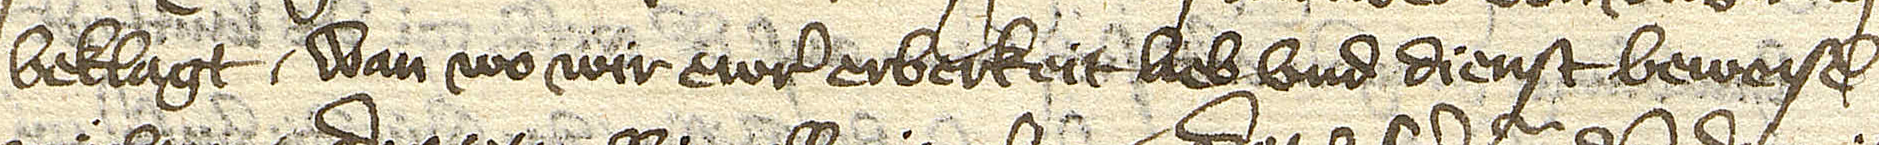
beklagt / wan wo wir ewr* erberkeit lieb vnd dienſt beweiſe*
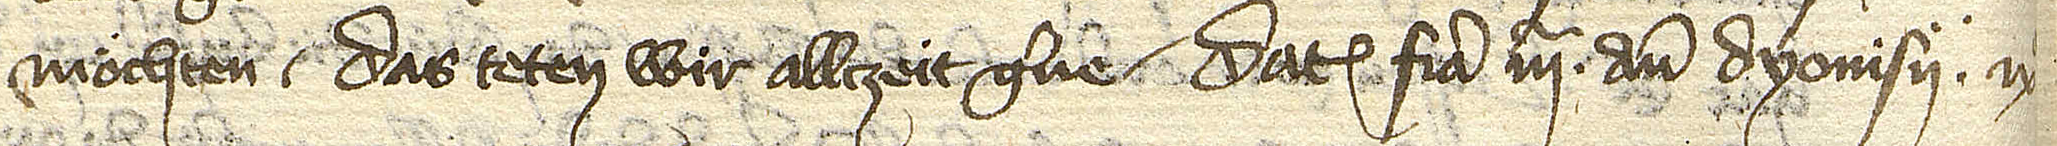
möchten / Das teten wir allcʒeit g*ne / Dat* fia* iii* An* dyoniſii . ix
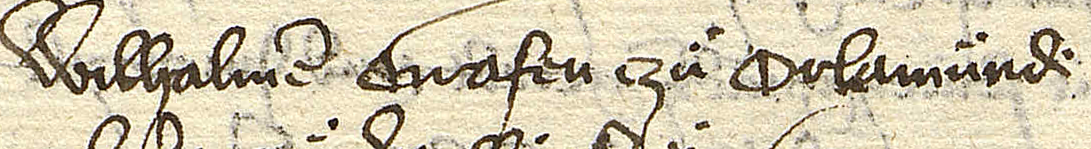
Wilhalme* Grafen cʒü Orlamünde
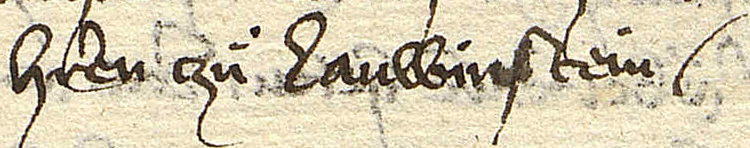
hr*en cʒü Lauwinſtein /
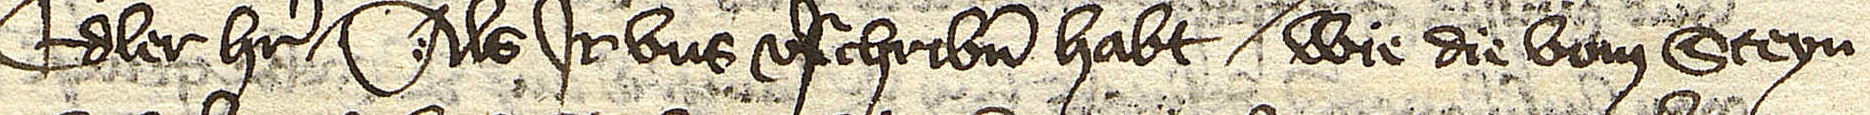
Edler hr* / Als Ir vns v*ſchribn* habt / wie die vom Steyn
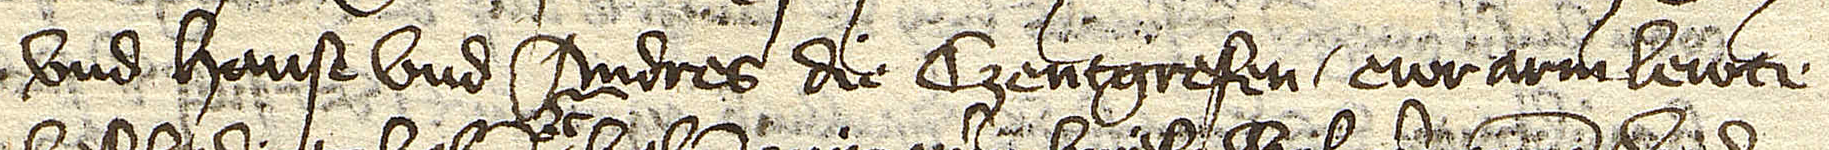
vnd hanſe vnd Andres die Cʒentgrefen / ewr arm lewte
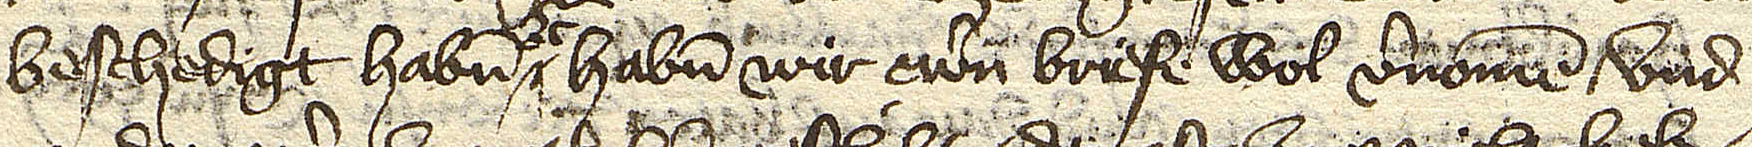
beſchedigt habn* / habn* wir ewn* briefe wol v*nome* / vnd
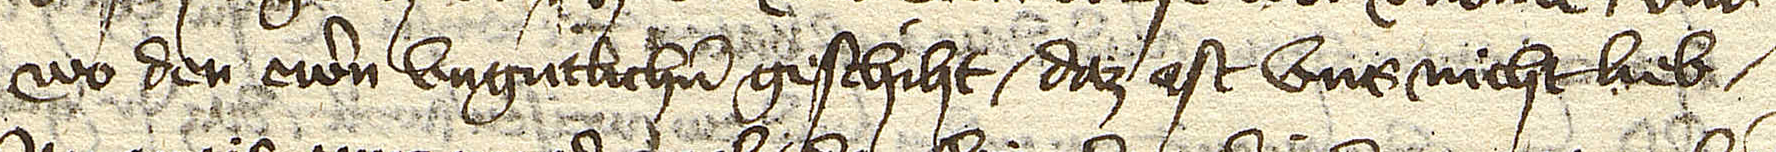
wo den ewn* vngutlichn* geſchiht / daʒ iſt vns nicht lieb /
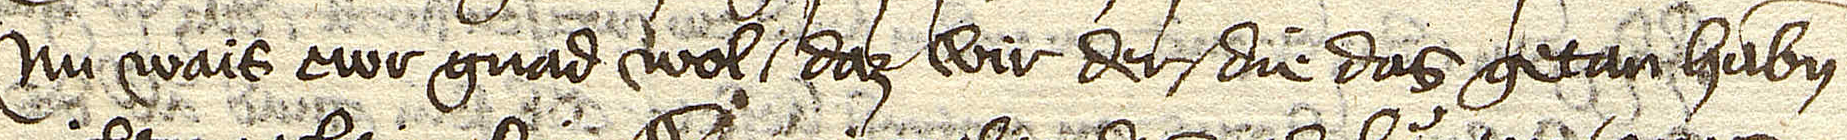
Nu wais ewr gnad wol / daʒ wir der / die das getan habn*
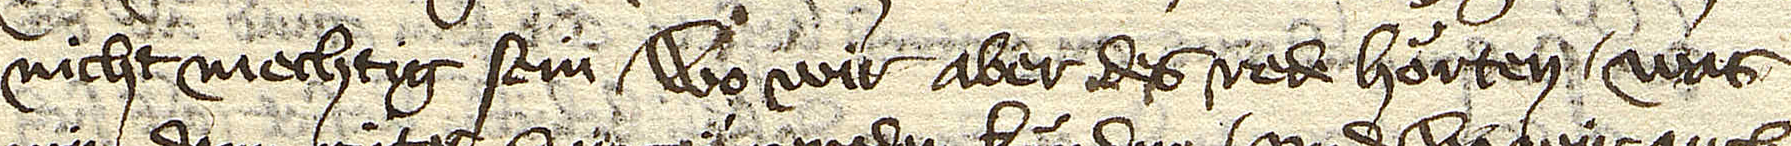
nicht mechtig ſein / Wo wir aber des rede hörten / was
